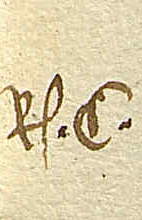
R* . C .
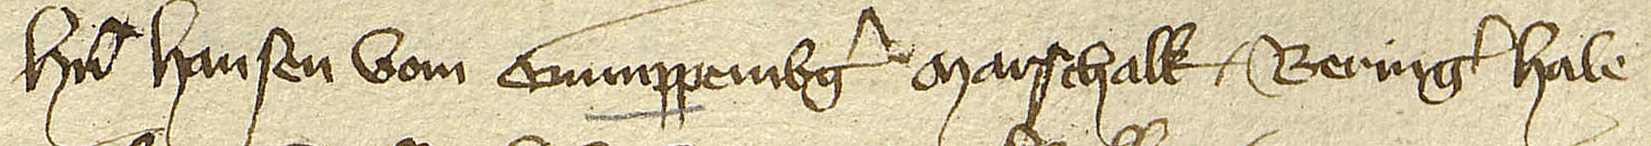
hn* hanſen von Gumppembg* Marſchalk / Bering* hale
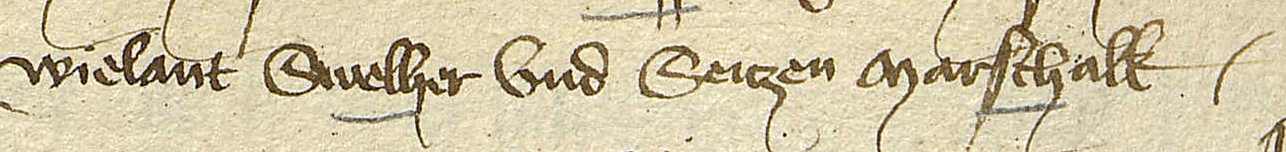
wielant Swelher vnd Seicʒen Marſchalk /
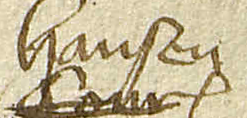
hanſen
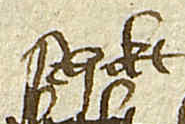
ſchikt
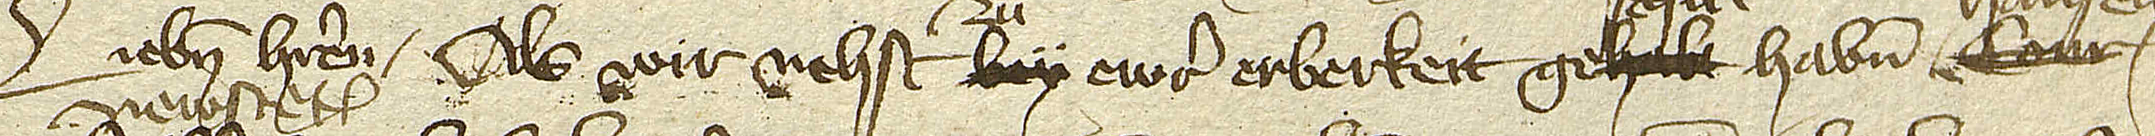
Liebn* hre*n / Als wir nehſt bey ewr* erberkeit gehabt habn* / Conr*
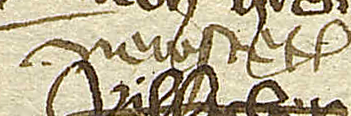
newſtet*
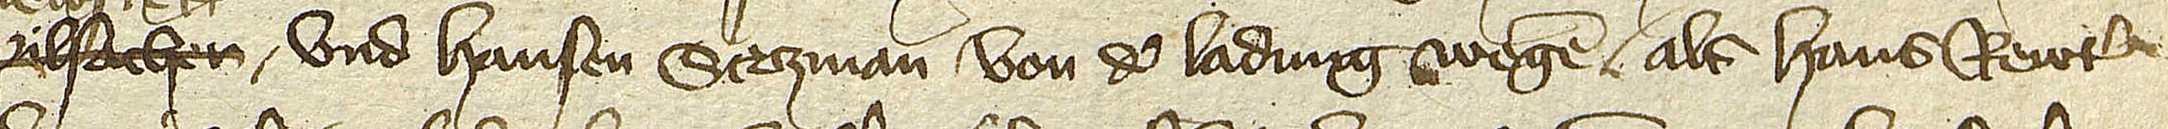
Pilſacher / vnd hanſen Stecʒman / von d* ladung wege* / als hans Rewt*
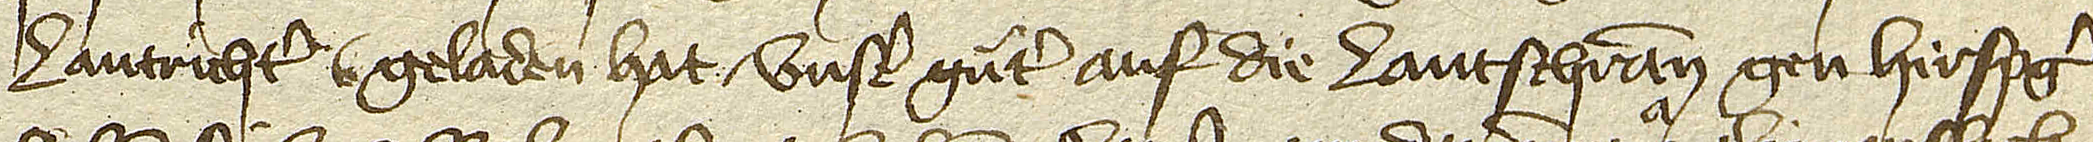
Lantricht* / geladen hat / vnſe* güt* auf die Lantſchran* gen hirſpg*
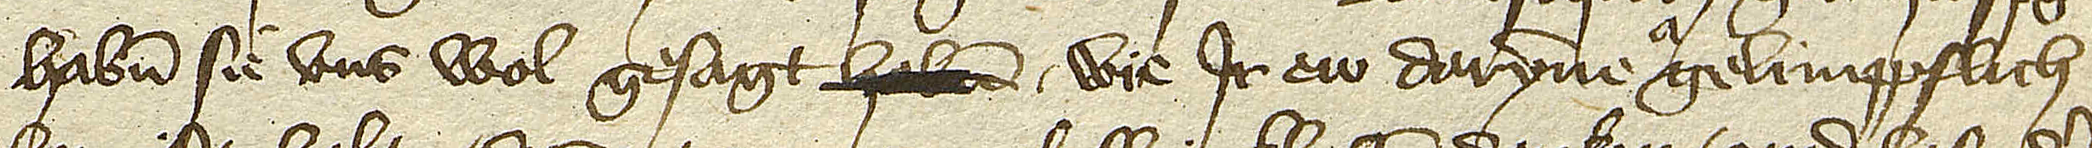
habn* ſie vns wol geſagt habn* / wie Ir ew daryne* gelimppflich
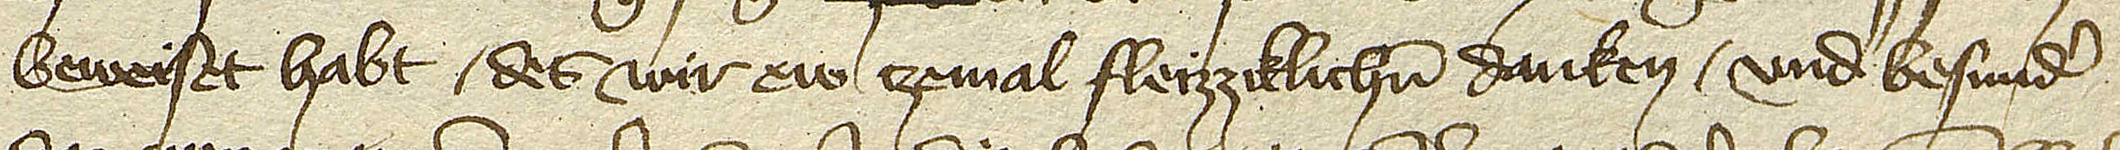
beweiſet habt / des wir ew cʒemal fleiʒʒiklichn* danken / vnd beſund*
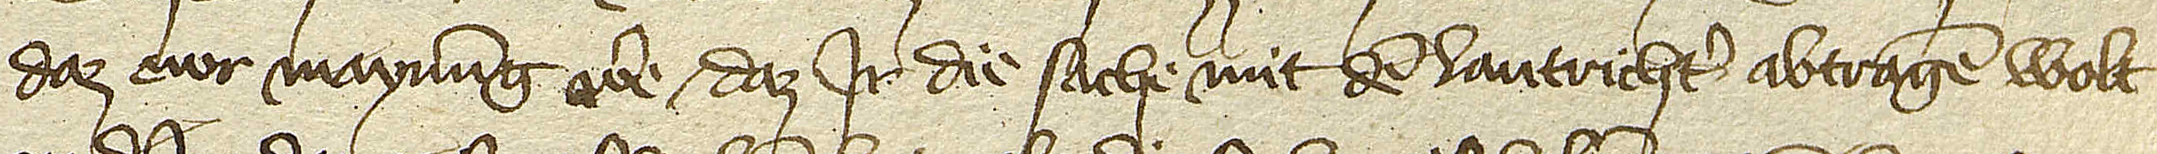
daʒ ewr maynu*g w*e / daʒ Ir die ſache mit d* lantricht* abtrage* wolt
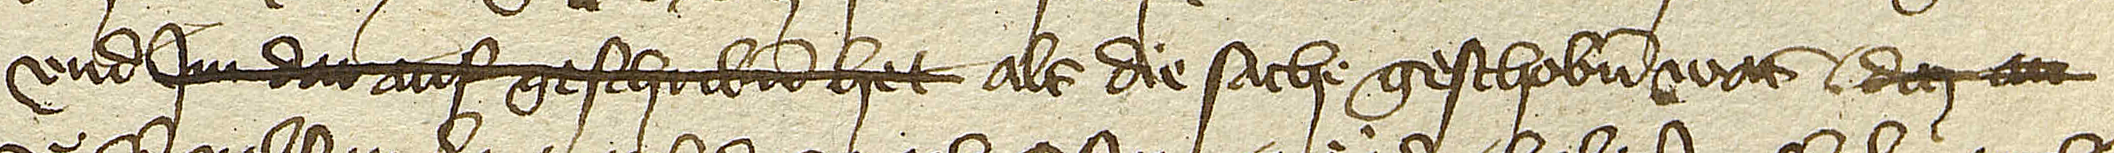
vnd Im dar auf geſchribn* het als die ſache geſchobn* was / daʒ au
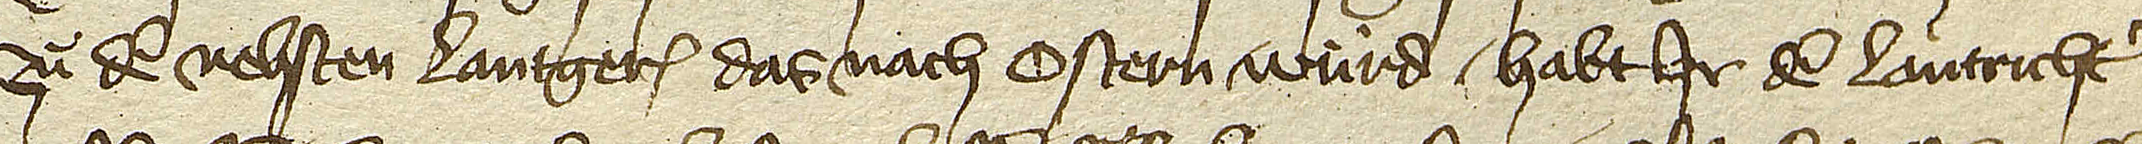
cʒü d* nehſten Lantger* das nach Ostern würd / habt Ir d* lantricht*
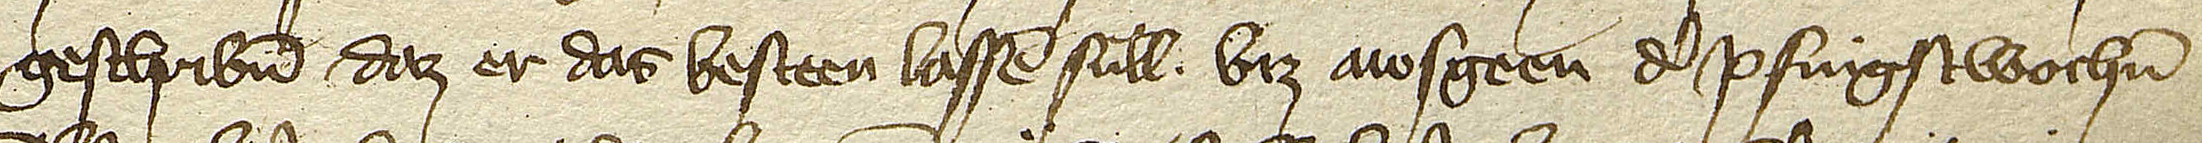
geſchribn* / daʒ er das beſteen laſſe* ſüll . biʒ awſgeen d* Pfingſtwochn*
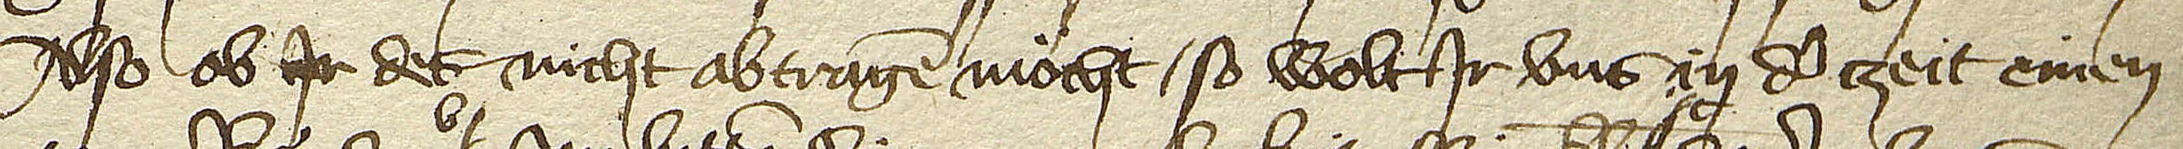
Alſo ob Ir des nicht abtrage* möcht / ſo wolt Ir vns in d* cʒeit einen
